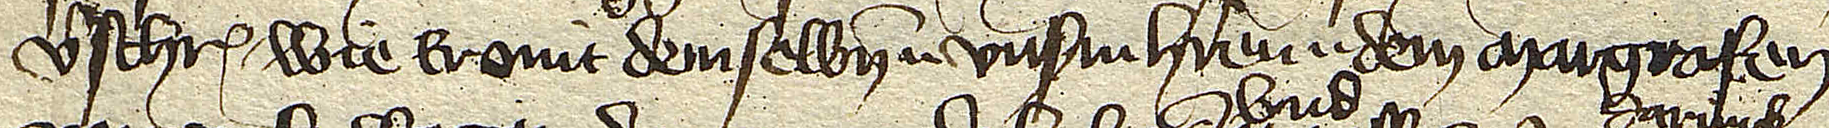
v*ſchr* / wie Er mit demſelbn* ~ vnſ*m h*ren ~ dem Margrafen
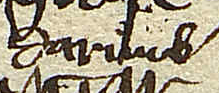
darümb
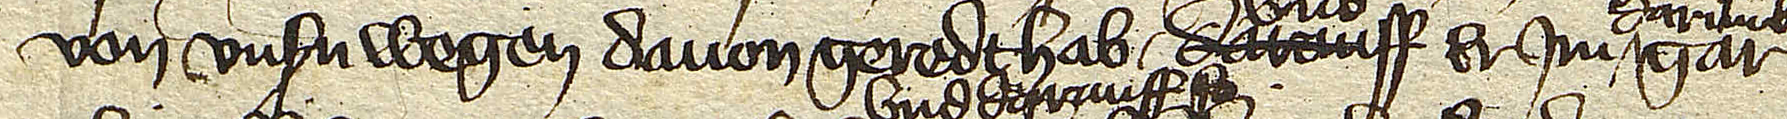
von vnſ*n wegen dauon geredt hab / Darauff Er Im gar
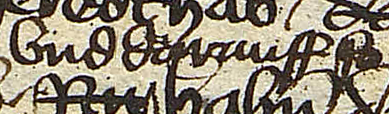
vnd darauff ſo
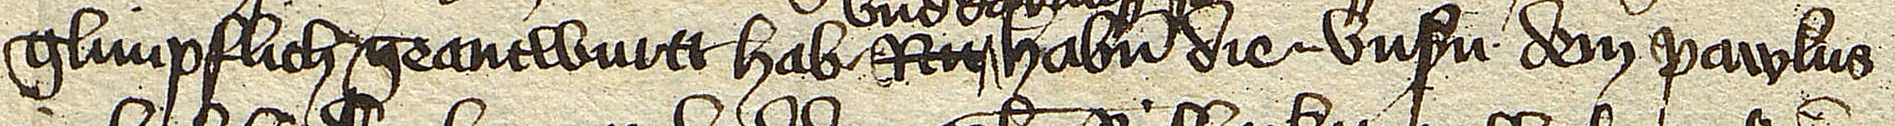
glimpflich geantwurt hab / Nu habn* die ~ vnſ*n dem Pawlus
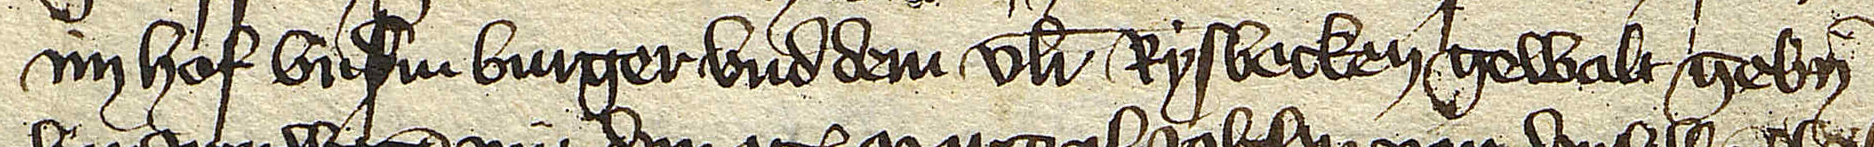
im hof vnſ*m burger / vnd dem vlr* Ryſbecken gewalt gebn*
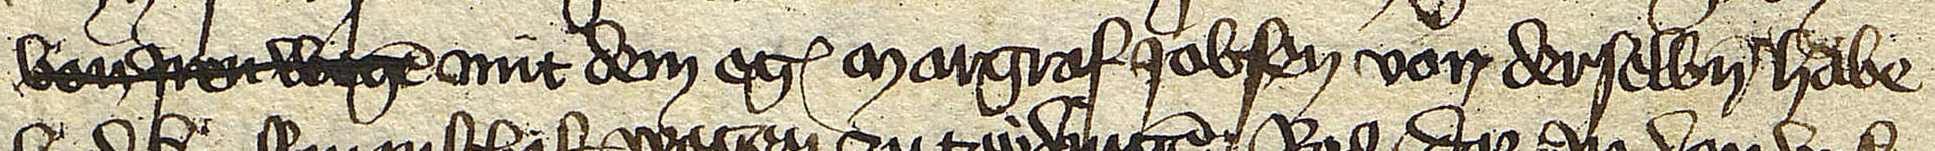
von Iren wege* mit dem eg* Margraf Iobſen von derſelbn* habe
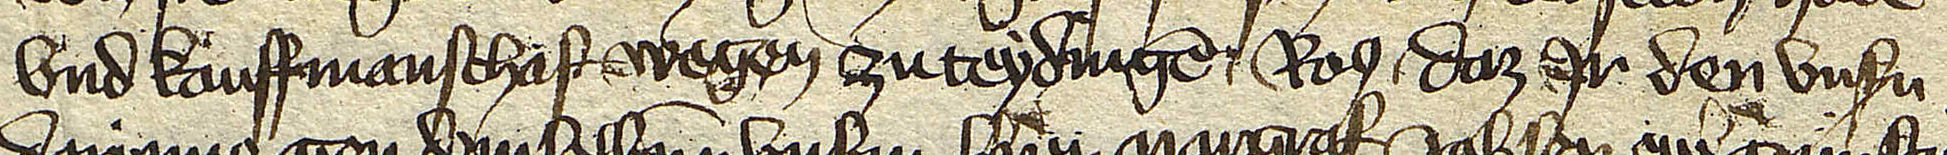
vnd kauffmanſchaft wegen cʒu teydinge* / Ro* / daʒ Ir den vnſ*n
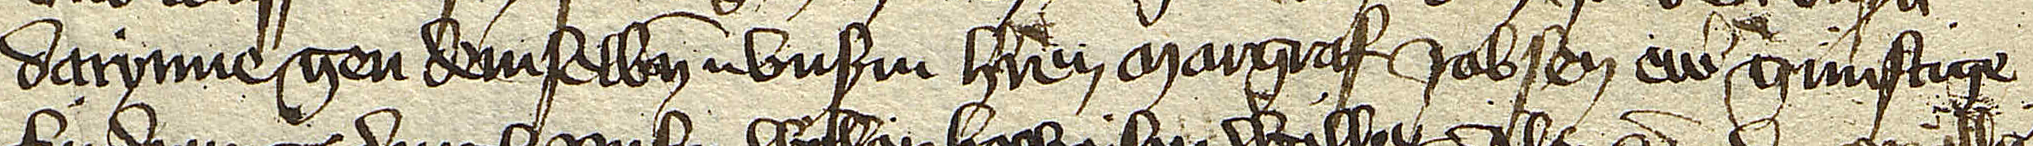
darynne gen demſelbn* ~ vnſ*m h*ren Margraf Iobſen ew* günſtige
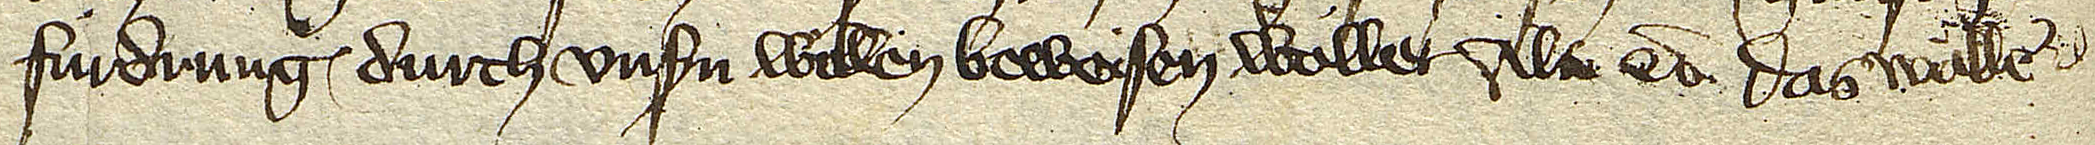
fürdrung* durch vnſ*n willen beweiſen wöllet Als ec* das wölle*
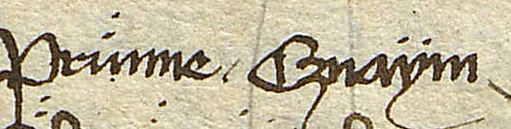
Prünne Cʒnaym
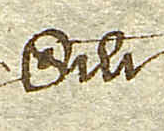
Silr*
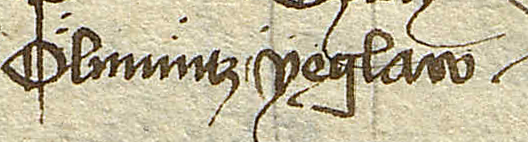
Ölmüntʒ / Yeglaw
